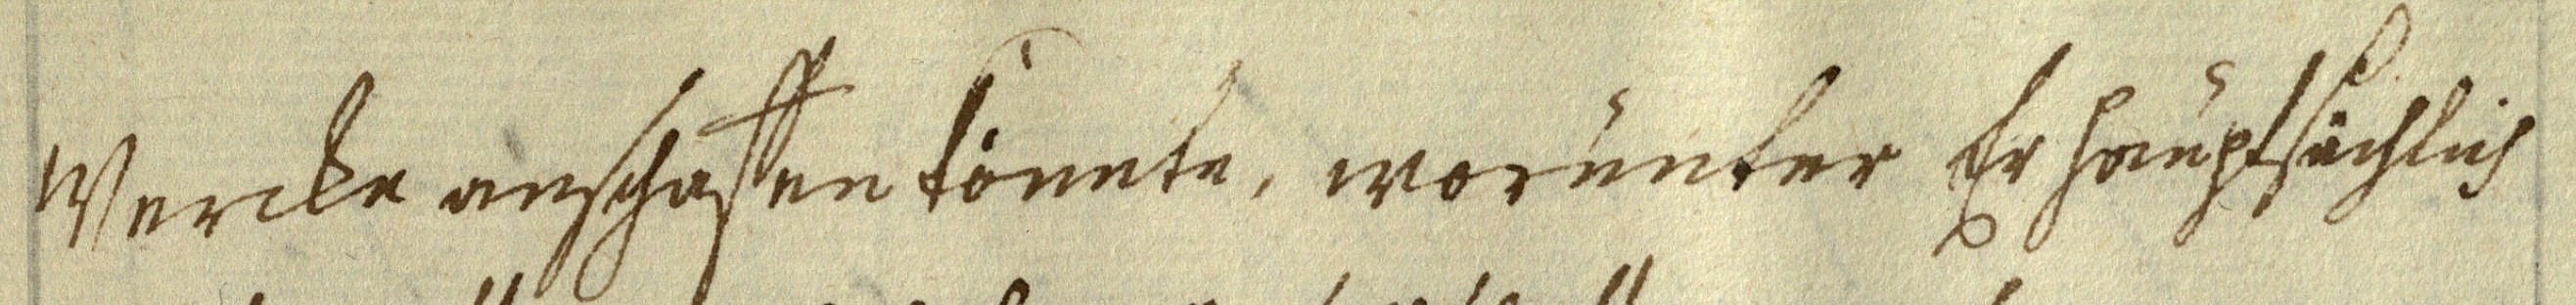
Wercke anschaffen könnte, worunter Er hauptsächlich
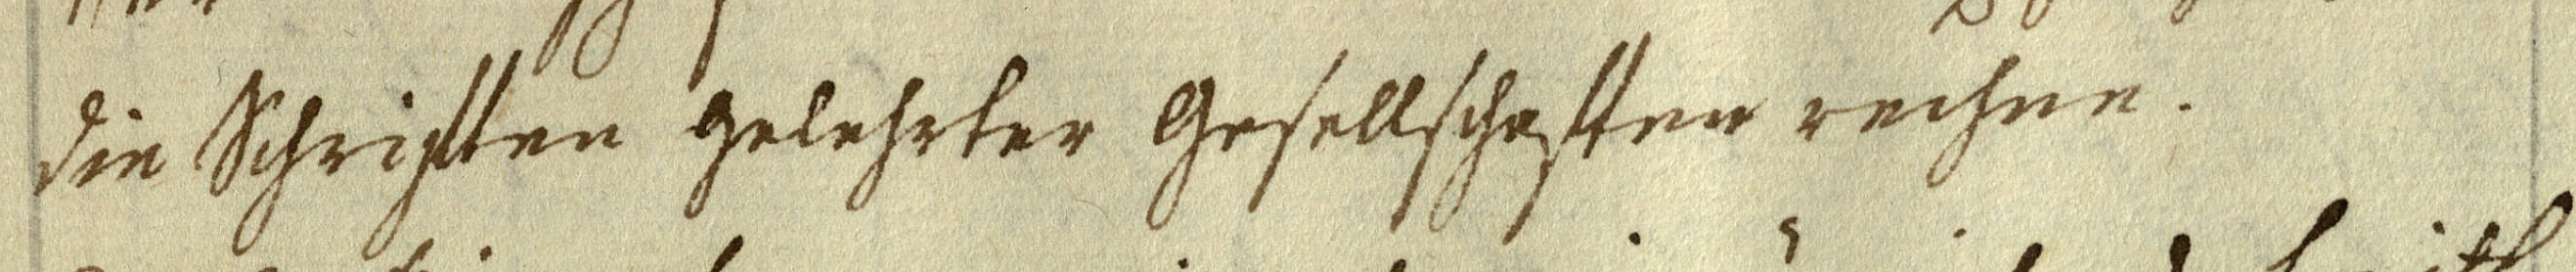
die Schriften Gelehrter Gesellschaften rechne.
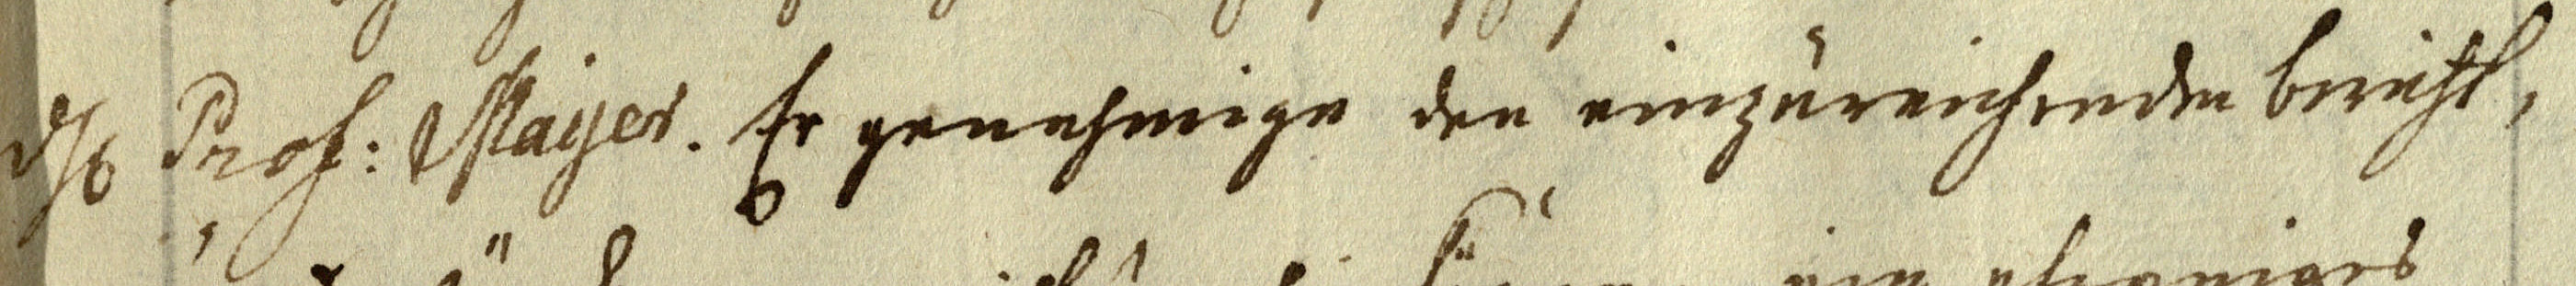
dh Prof: Maÿer. Er genehmige den einzureichenden Bericht,
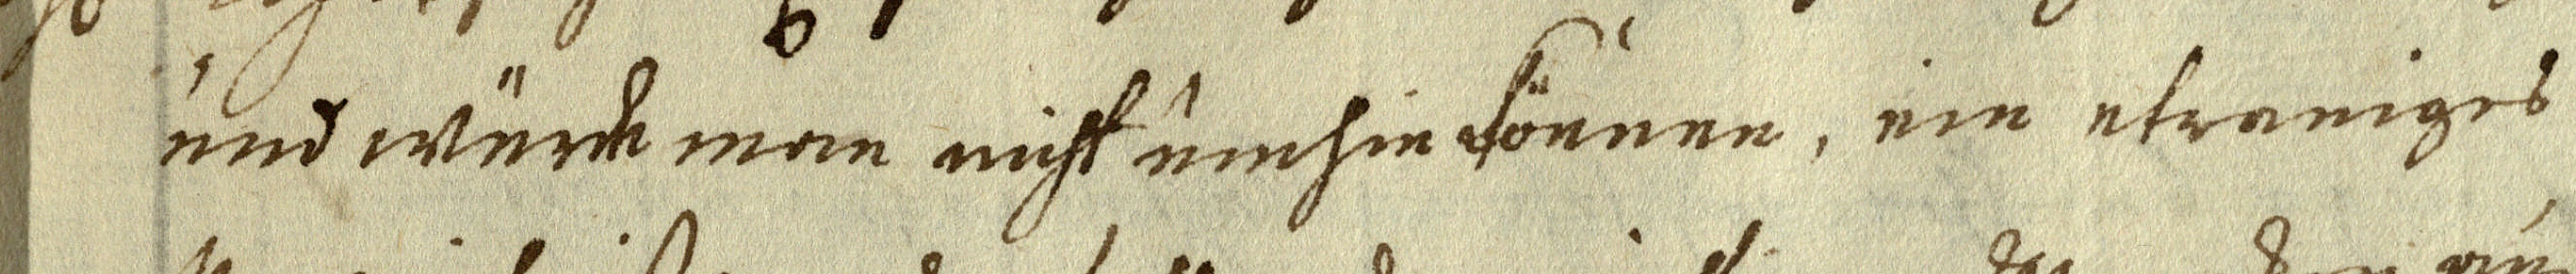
und würde man nicht umhin können, ein etwaniges
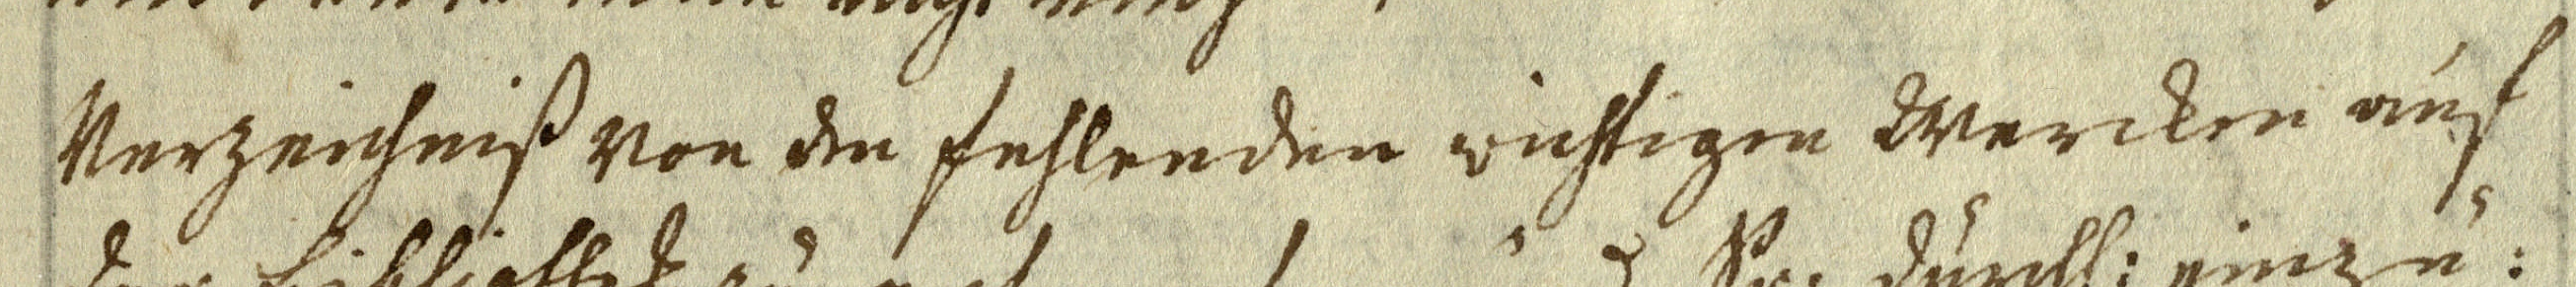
Verzeichniß von den fehlenden wichtigen Wercken auf
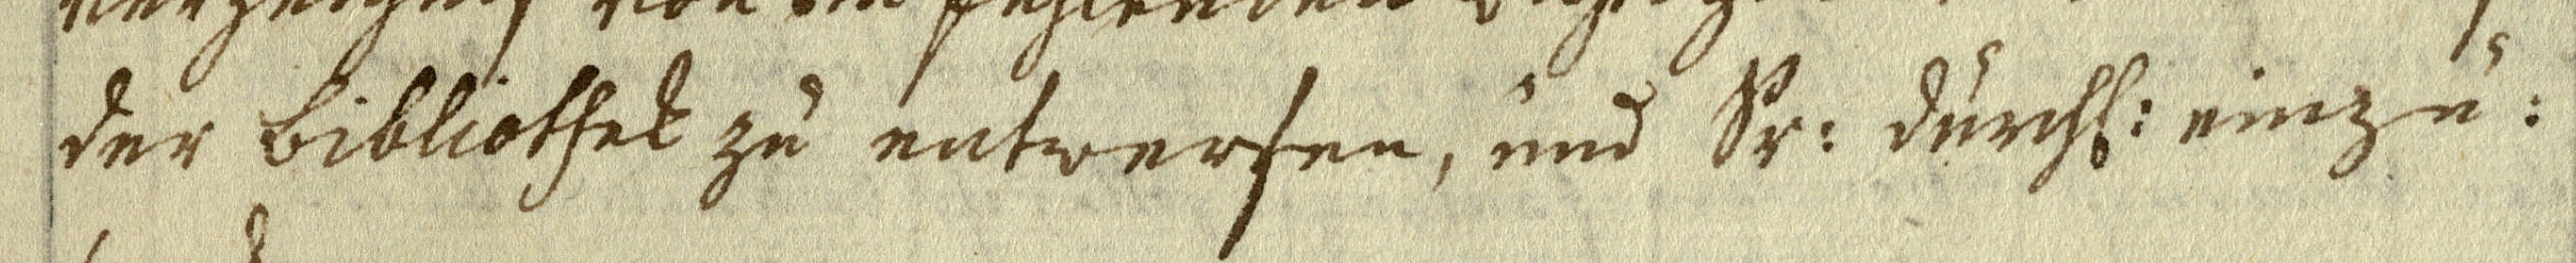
der Bibliothek zu entwerfen, und Sr. Durchl. einzu¬
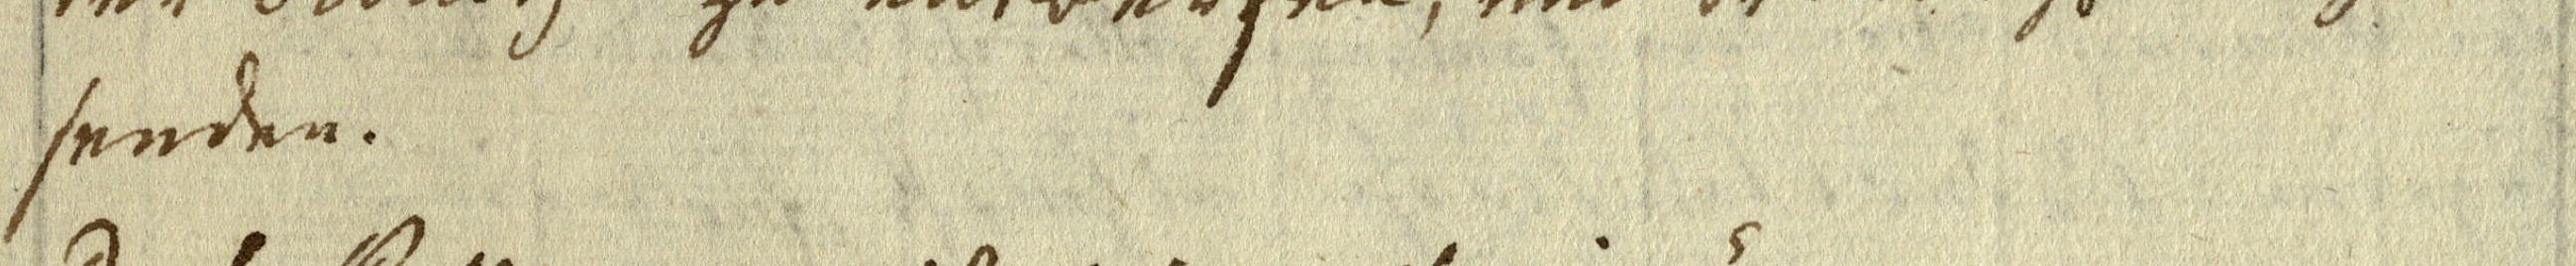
senden.
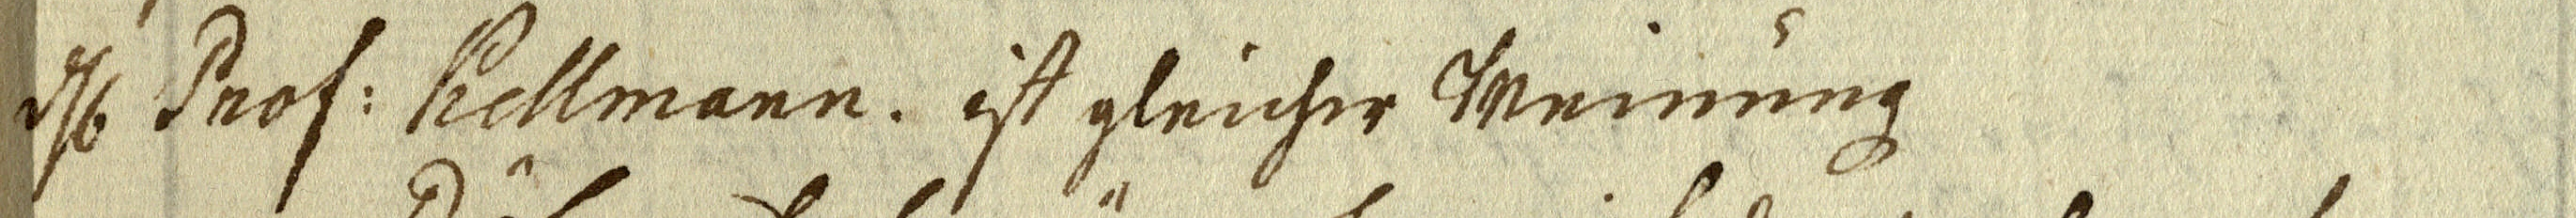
dh Prof: Kellmann. ist gleicher Meinung
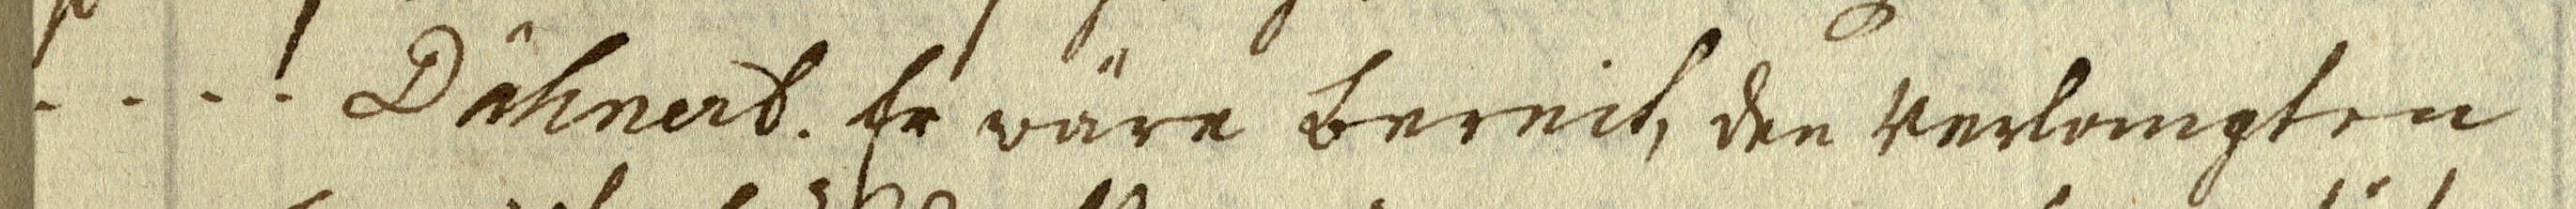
Dähnert. Er wäre bereit, den verlangten
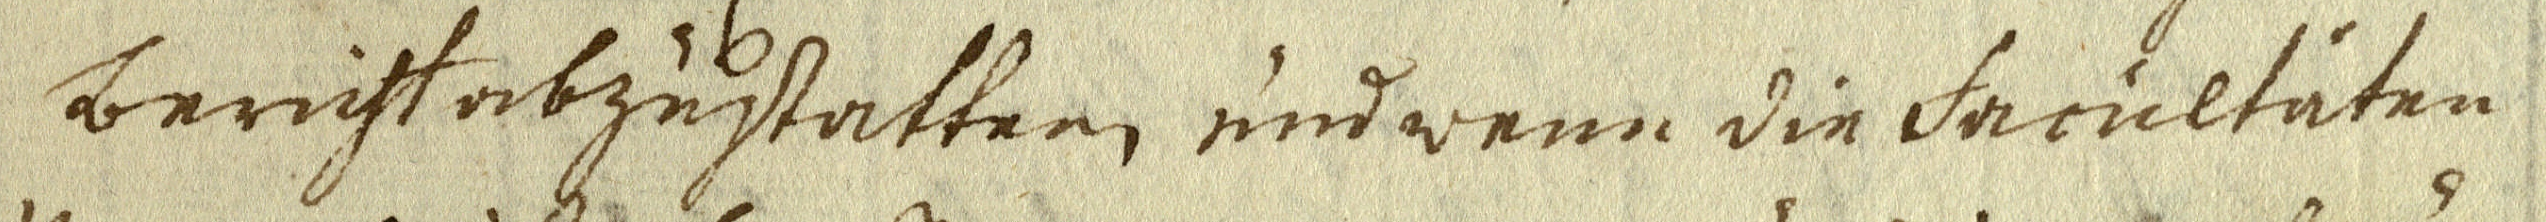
Bericht abzustatten, und wenn die Facultäten
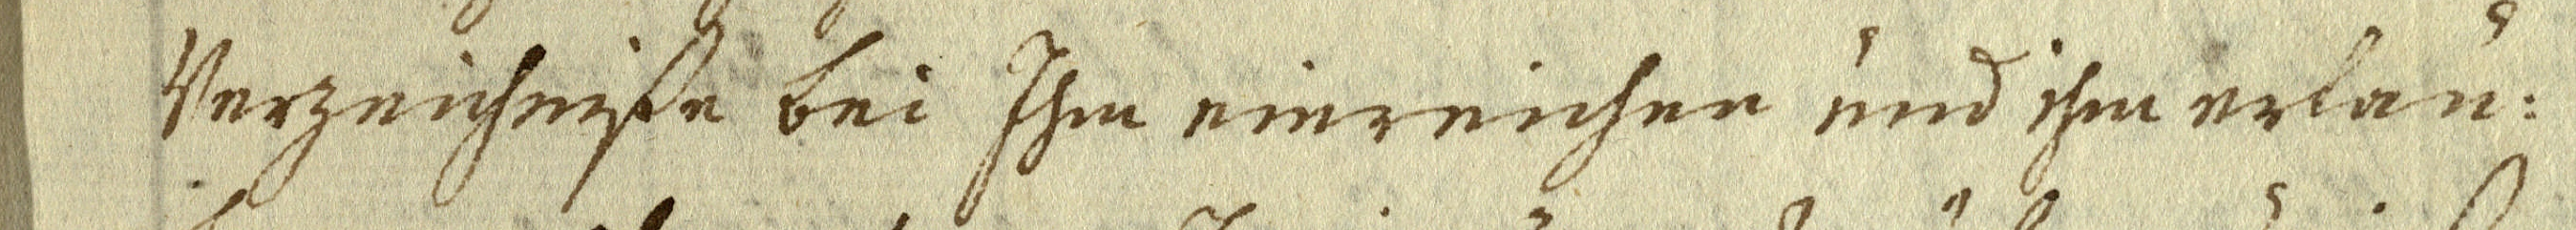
Verzeichniße bei Ihm einreichen und ihm erlau¬
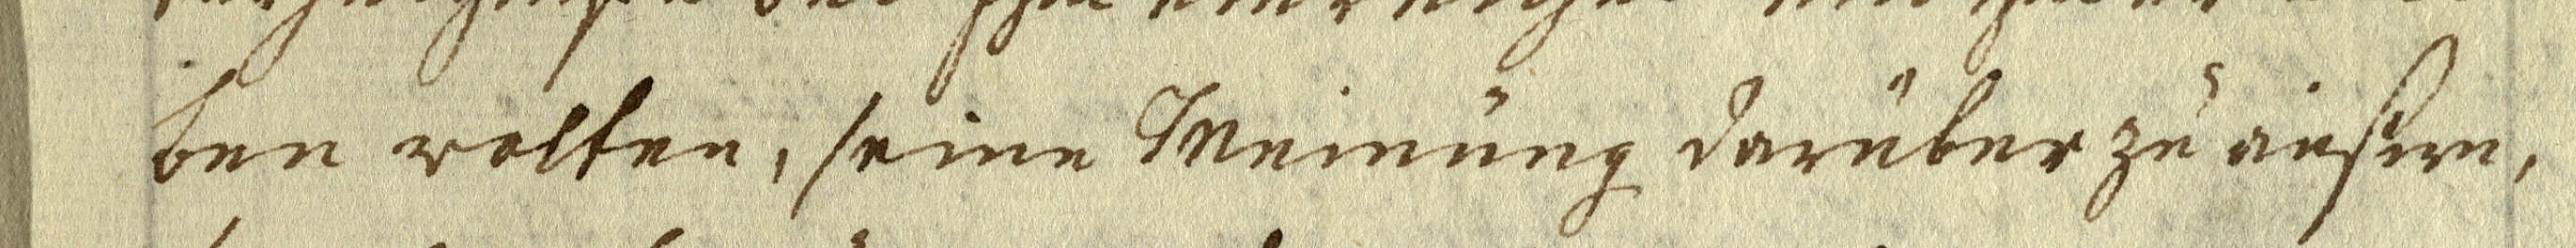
ben wolten, seine Meinung darüber zu äußern,
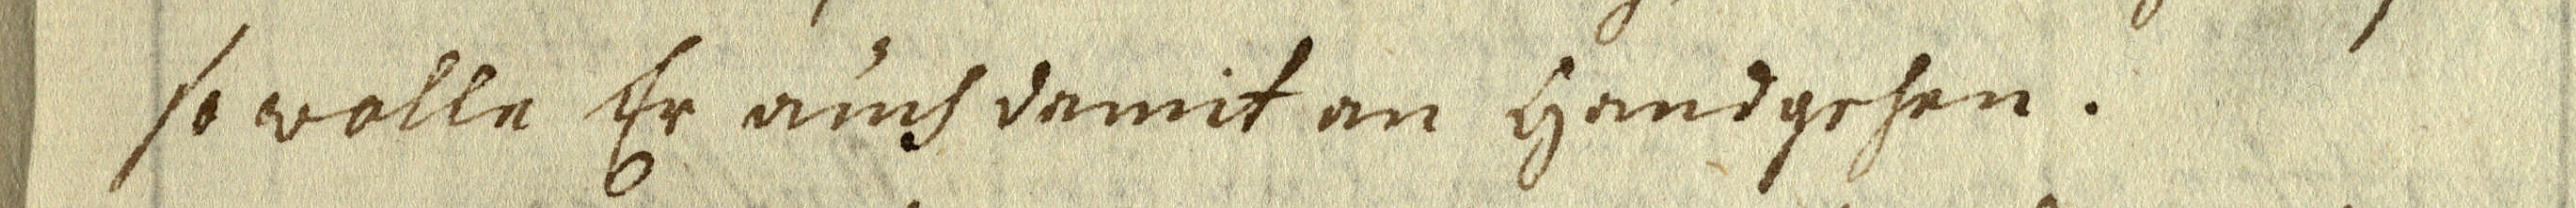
so wolle Er auch damit an Hand gehen.
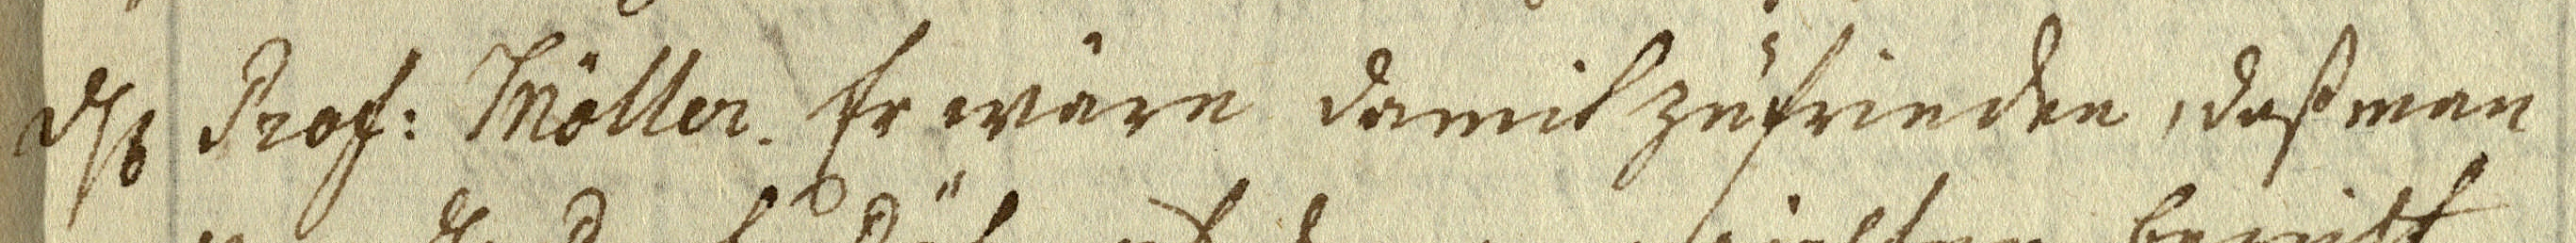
dh Prof: Möller. Er wäre damit zufrieden, daß man
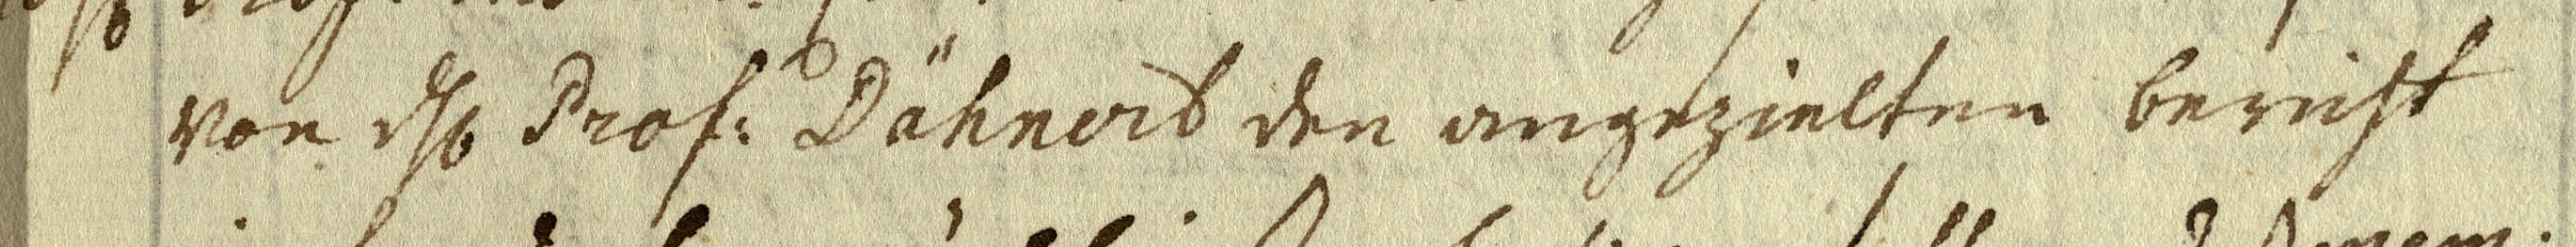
von dh Prof: Dähnert den angezielten bericht
